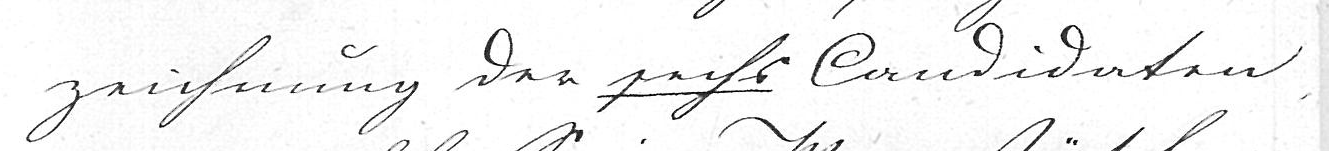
zeichnung der sechs Candidaten
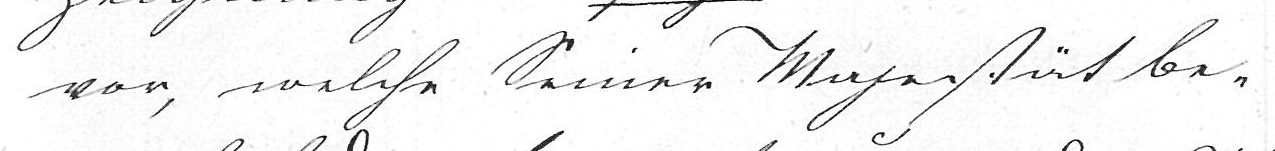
vor, welche Seiner Majestät be-
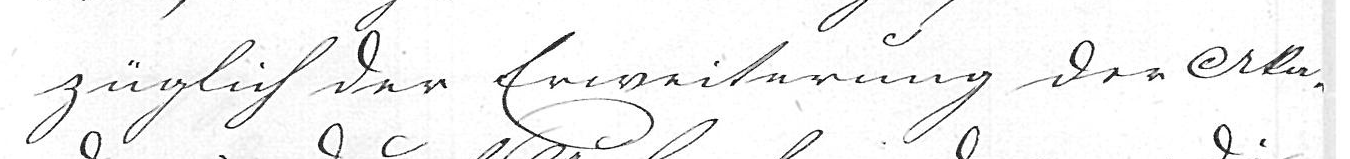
züglich der Erweiterung der Aka-
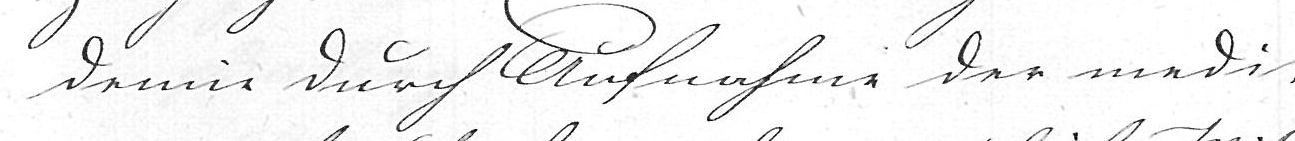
demie durch Aufnahme der medi-
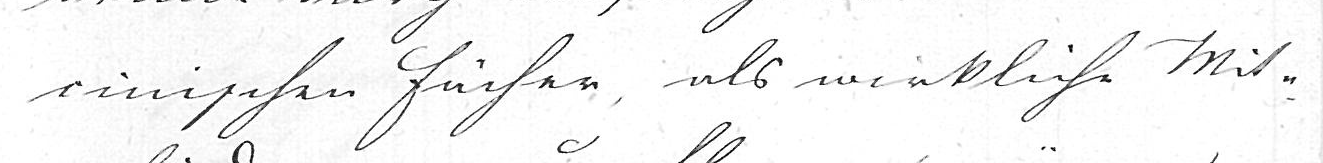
cinischen Fächer, als wirkliche Mit-
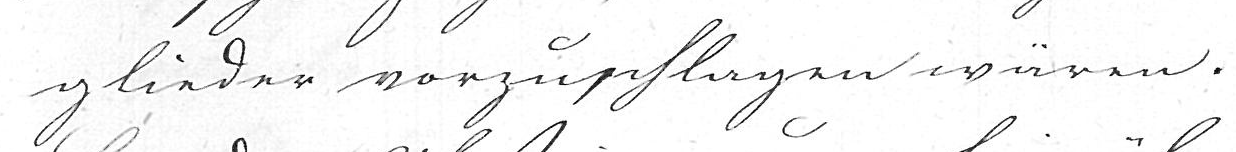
glieder vorzuschlagen wären.
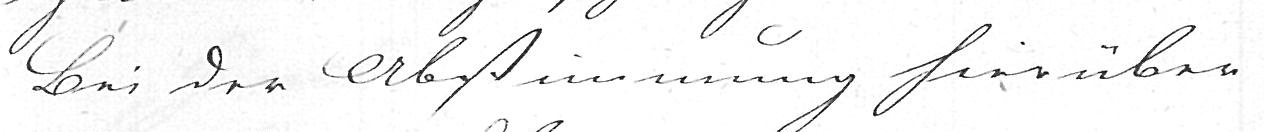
Bei der Abstimmung hierüber
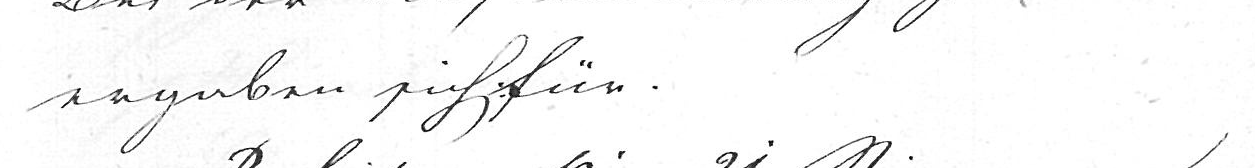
ergaben sich für
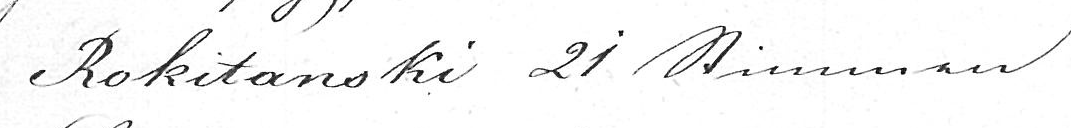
Rokitanski 21 Stimmen
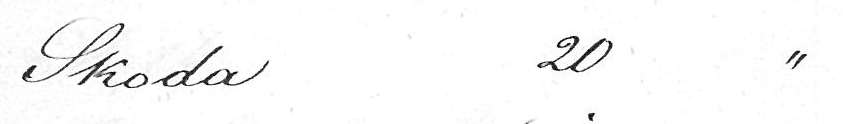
Skoda 20 "
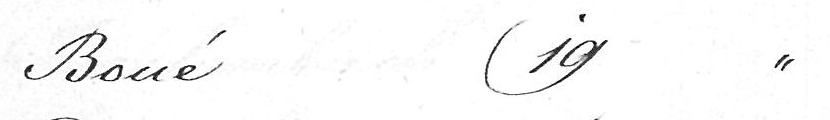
Boué 19 "
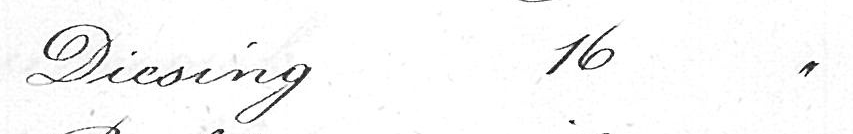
Diesing 16 "
